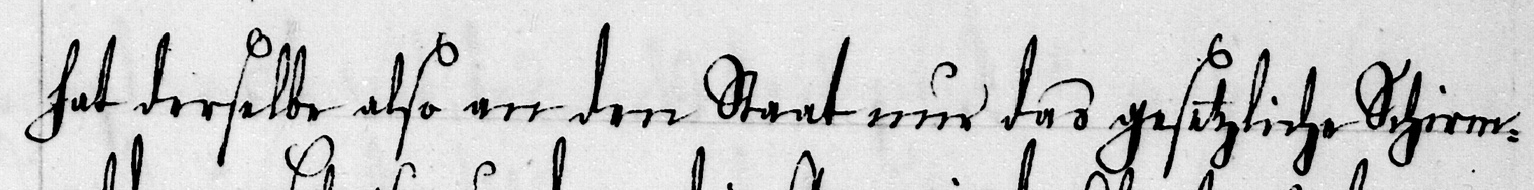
hat derselbe also an den Staat nur das gesetzliche Schirm¬
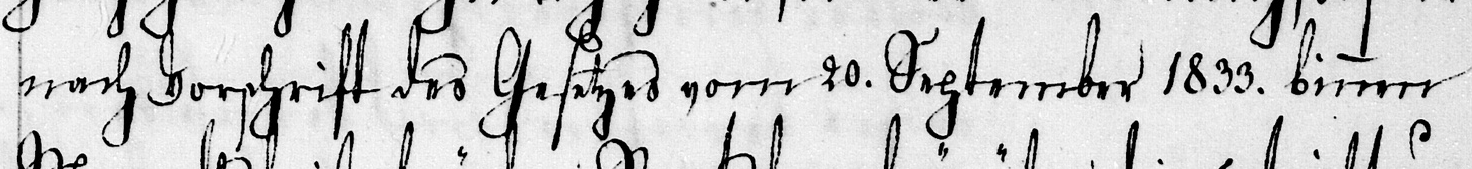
nach Vorschrift des Gesetzes vom 20. September 1833. binnen
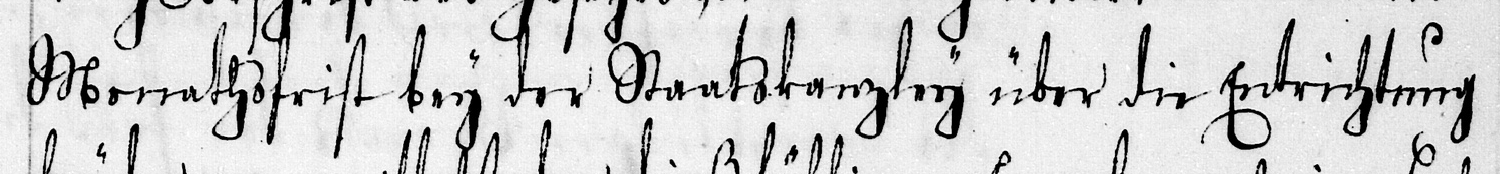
Monathsfrist bey der Staatskanzley über die Entrichtung
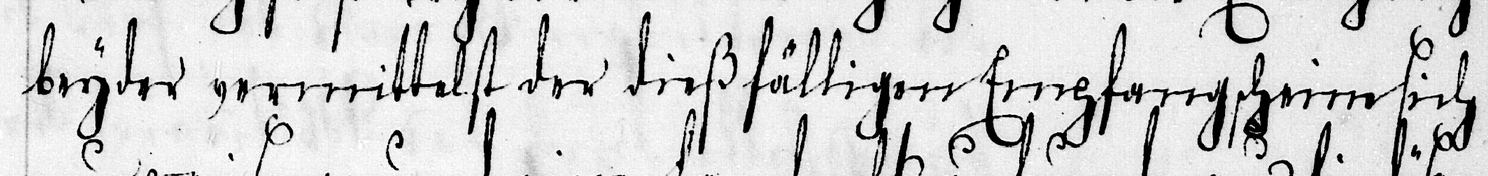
beyder vermittelst der dießfälligen Empfangscheine sich
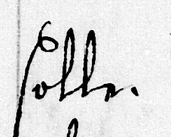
solle.
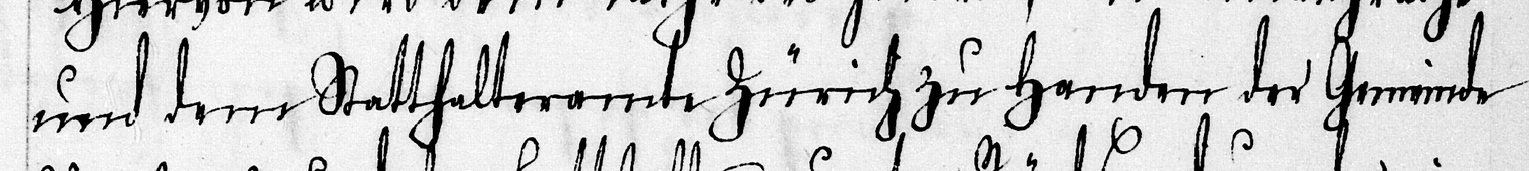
und dem Statthalteramte Zürich zu Handen der Gemeinde
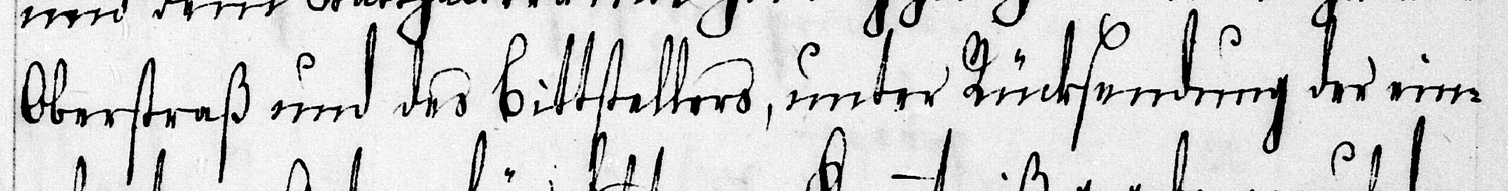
Oberstraß und des Bittstellers, unter Rücksendung der ein¬
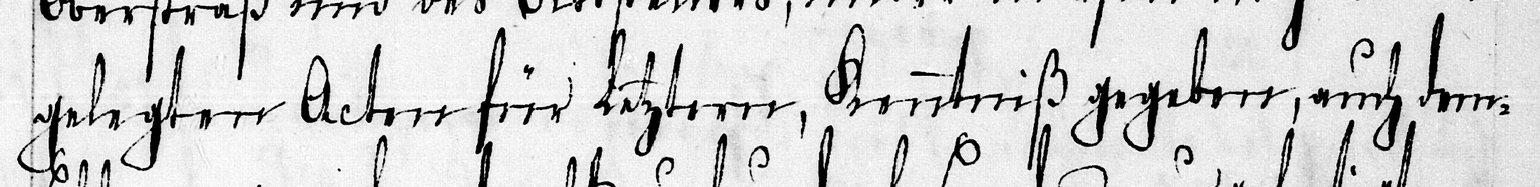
gelegten Acten für Letztern, Kenntniß gegeben, auch dem¬
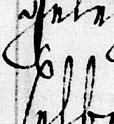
ger¬
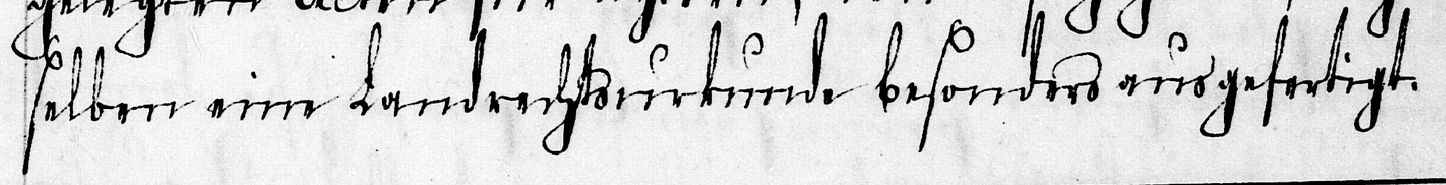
selben eine Landrechtsurkunde besonders ausgefertigt.
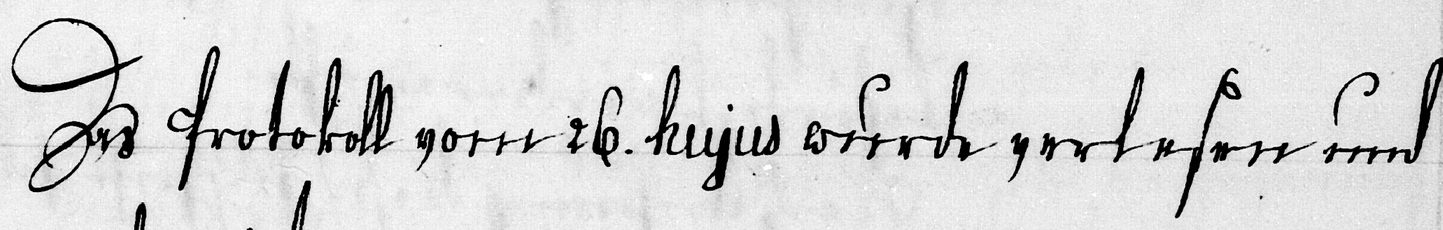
Das Protokoll vom 26. hujus wurde verlesen und
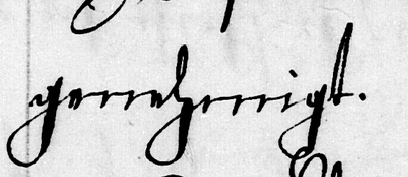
genehmigt.
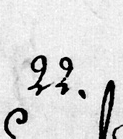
22.
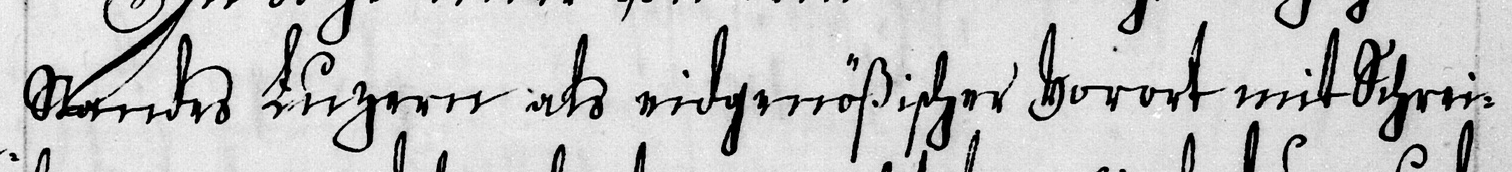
Standes Luzern als eidgenößischer Vorort mit Schrei¬
